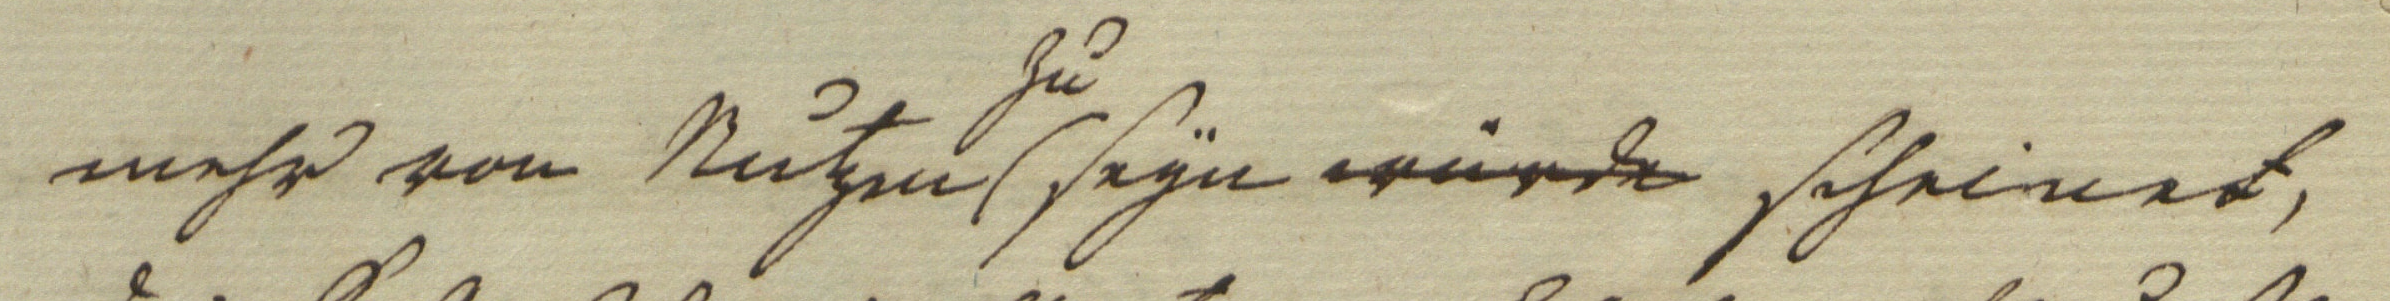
mehr von Nutzen zu seÿn würde scheinet,
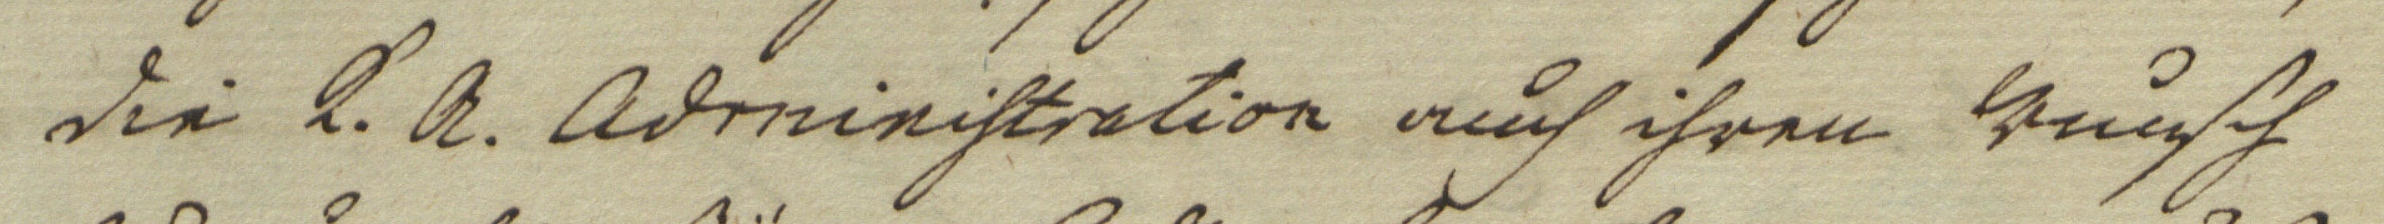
die K. A. Administration auch ihren Wunsch
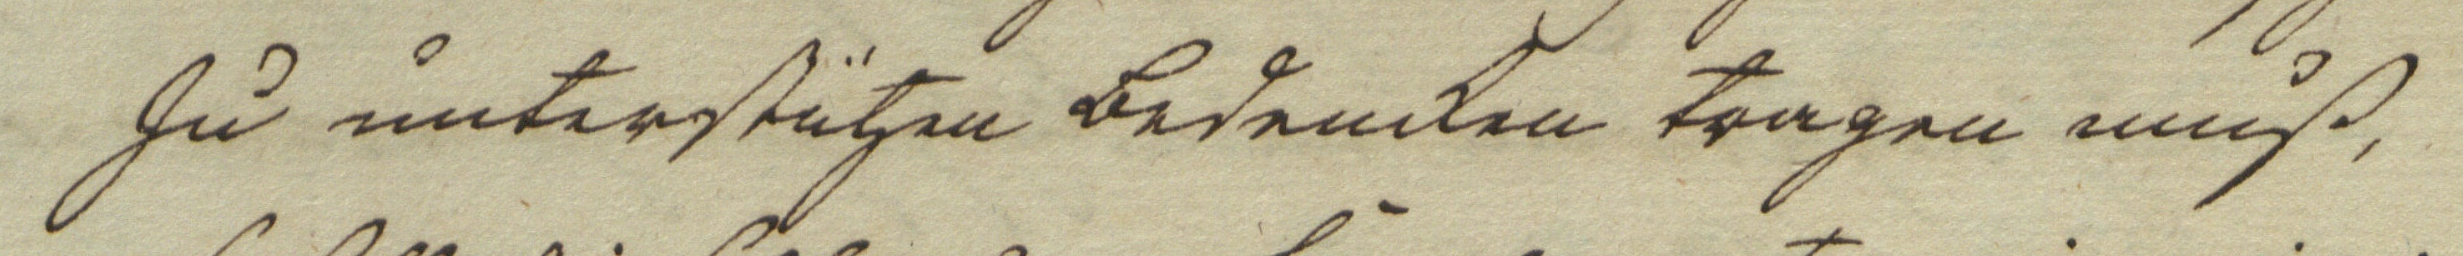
zu unterstützen Bedencken tragen muß,
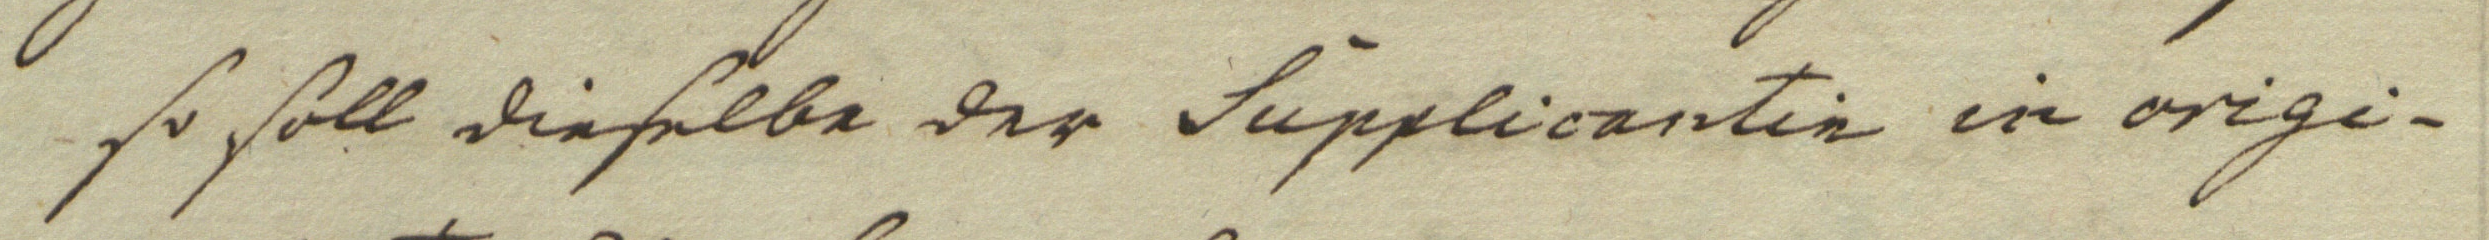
so soll dieselbe der Supplicantin in origi¬
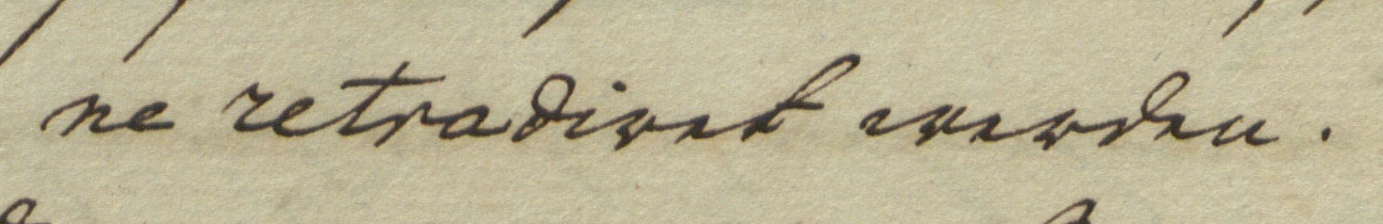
ne retradiret werden.
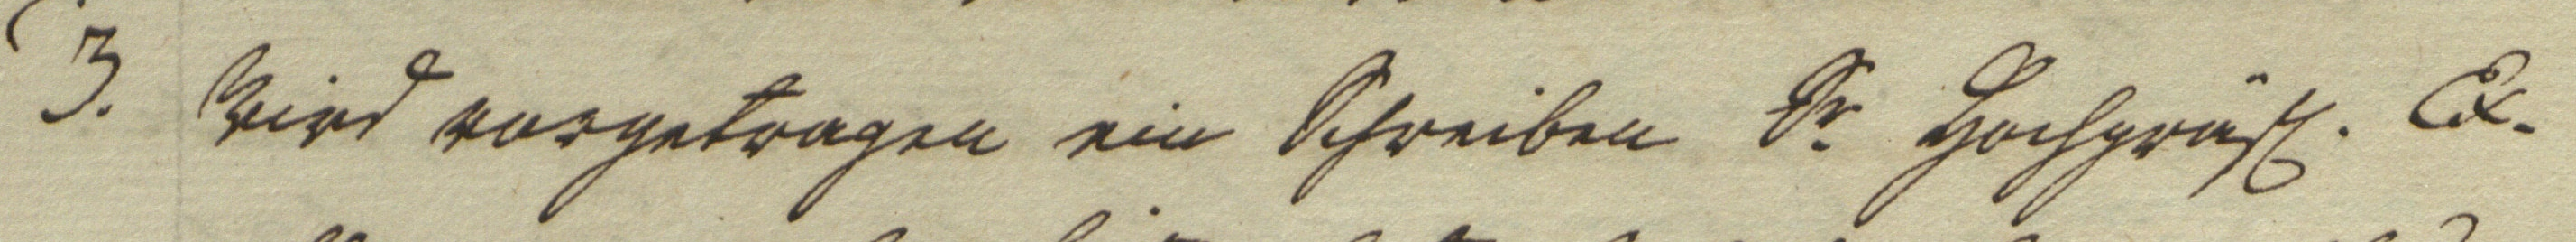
3. Wird vorgetragen ein Schreiben Sr Hochgräfl. Ex¬
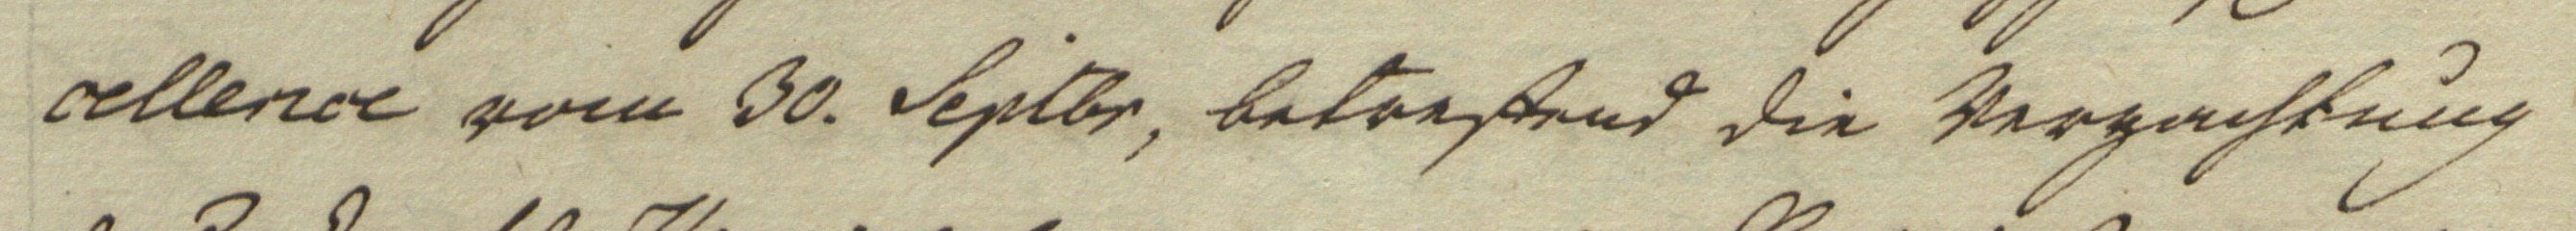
cellence vom 30. Septbr, betreffend die Verpachtung
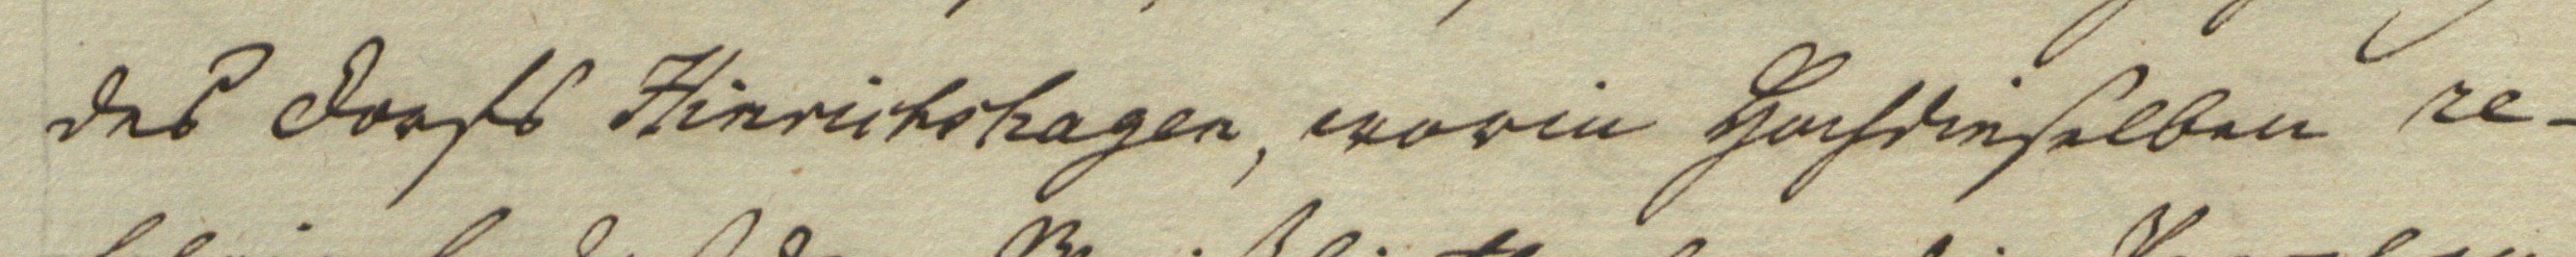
des Dorfs Hinrichshagen, worin Hochdieselben re¬
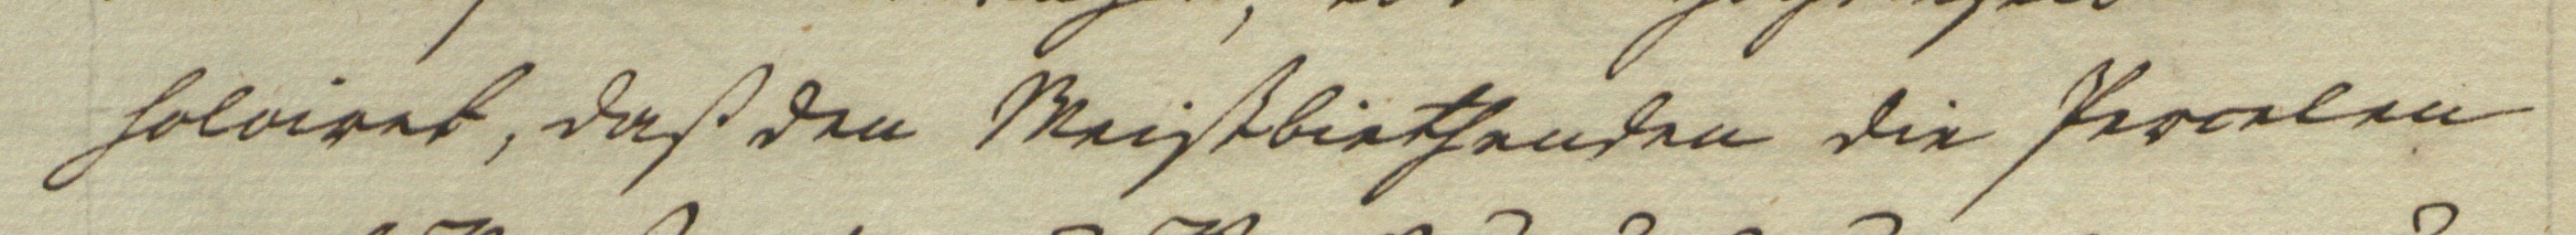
solviret, daß den Meistbiethenden die Percelen
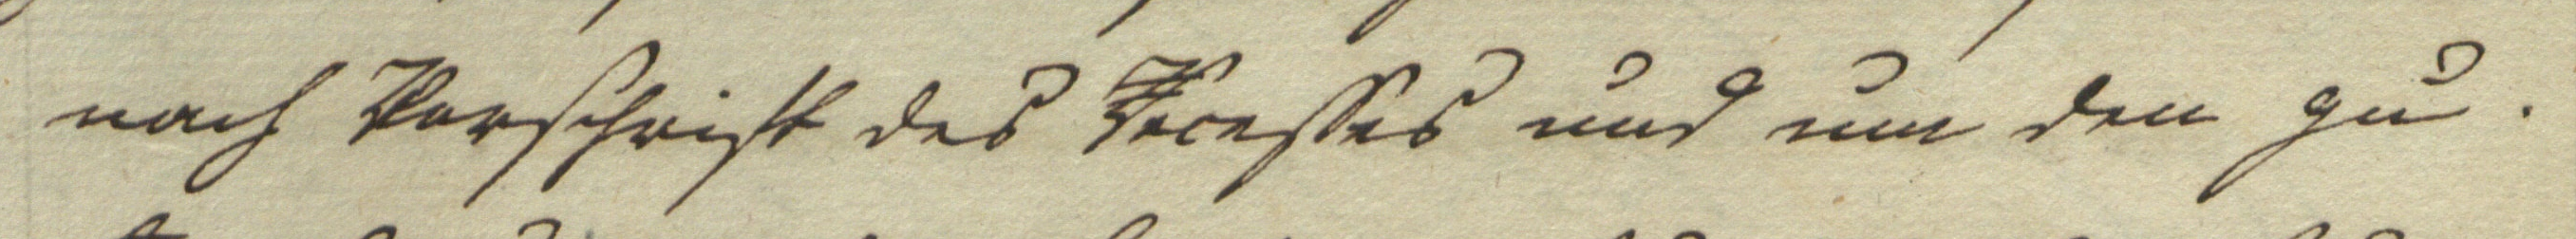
nach Vorschrift des Recesses und eine den gu¬
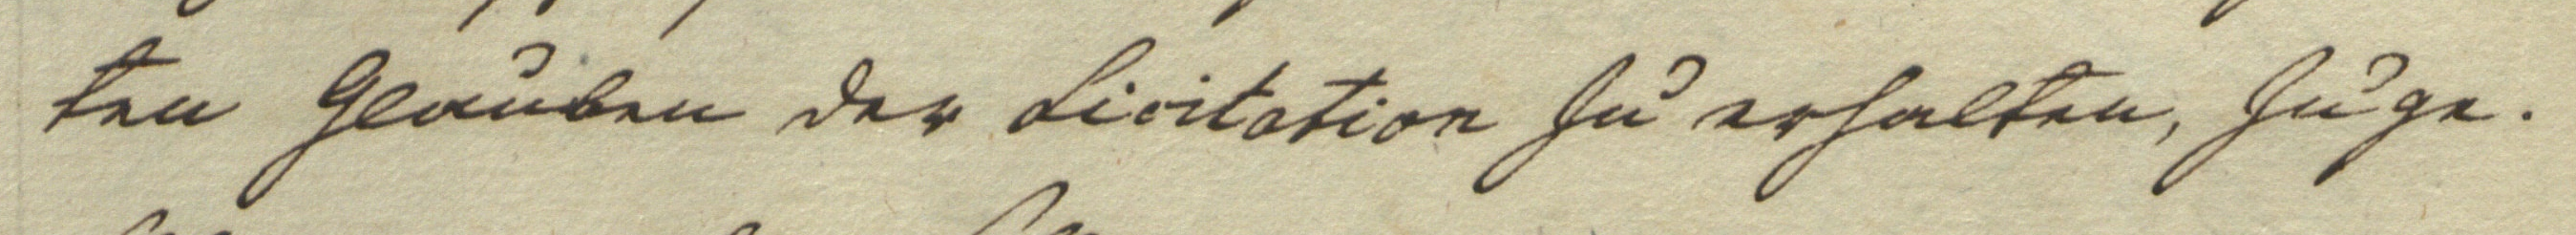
ten Glauben der Licitation zu erhalten, zuge¬
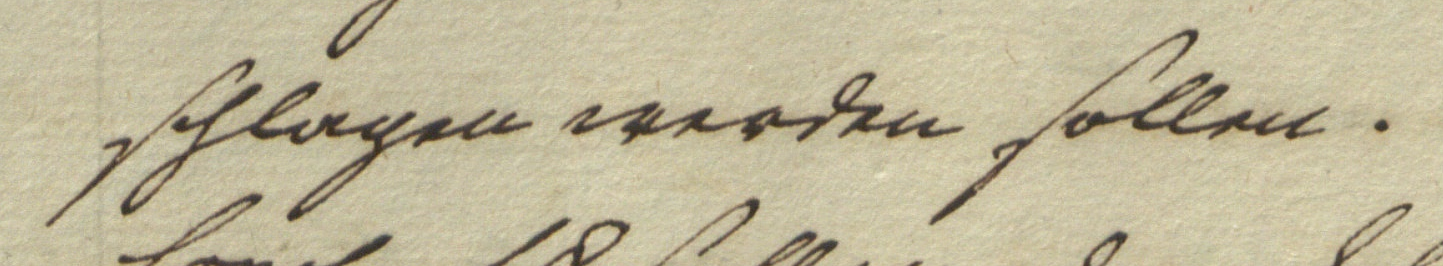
schlagen werden sollen.
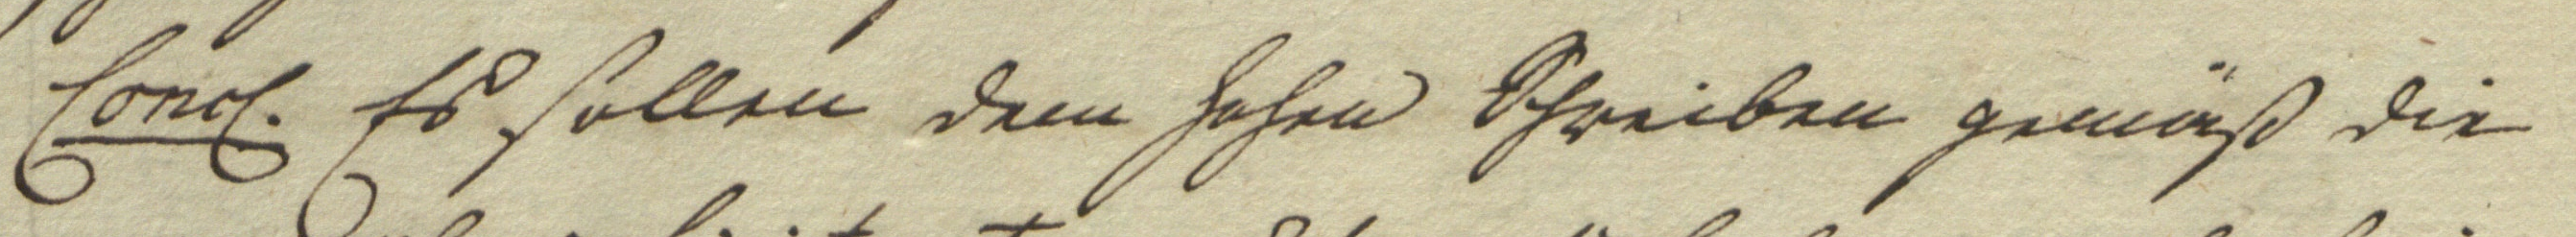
Concl. Es sollen dem hohen Schreiben gemäß die
